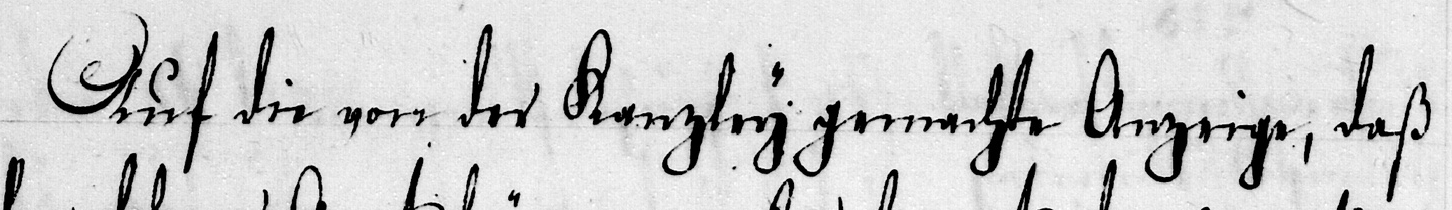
Auf die von der Kanzley gemachte Anzeige, daß
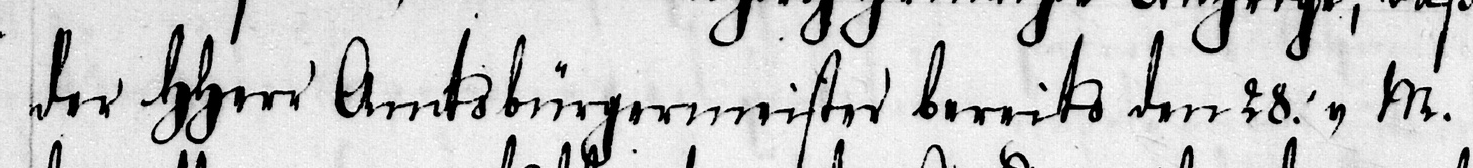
der HHerr Amtsbürgermeister bereits den 28. v. M.
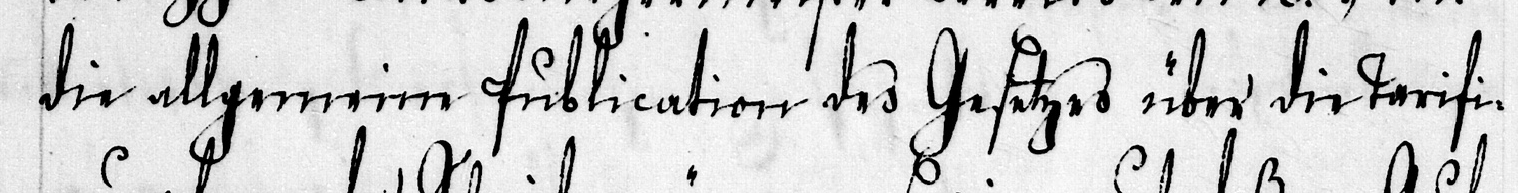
die allgemeine Publication des Gesetzes über die Tarifi¬
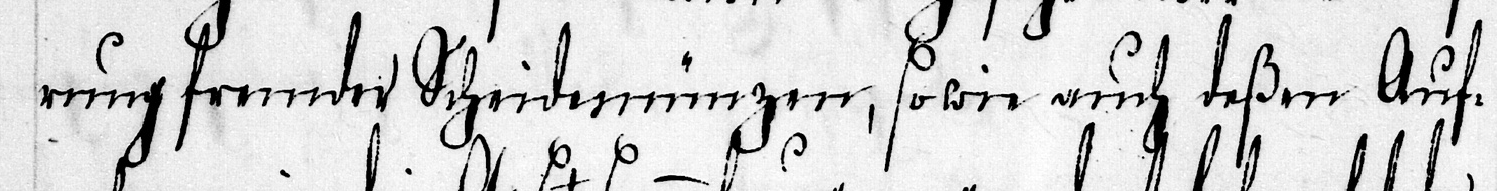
rung fremder Scheidemünzen, sowie auch deßen Auf¬
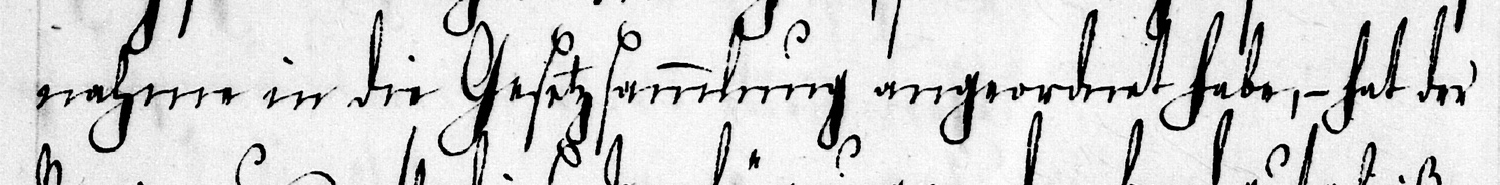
nahme in die Gesetzsammlung angeordnet habe, – hat der
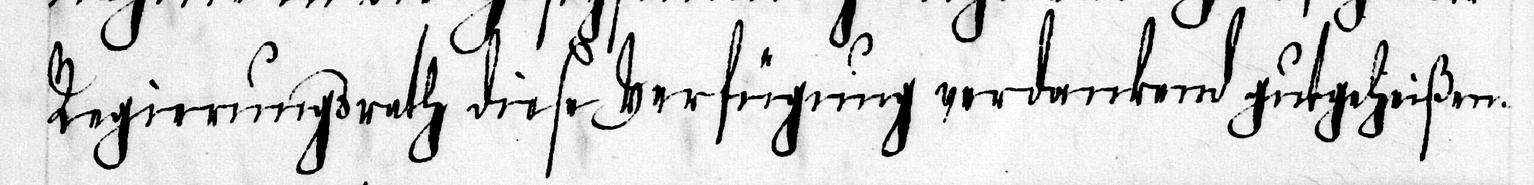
Regierungsrath diese Verfügung verdankend gutgeheißen.
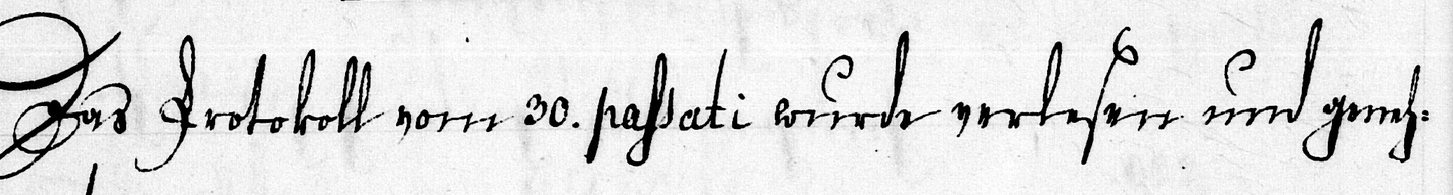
Das Protokoll vom 30. passati wurde verlesen und geneh¬
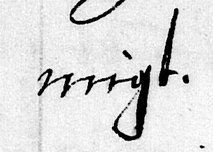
migt.
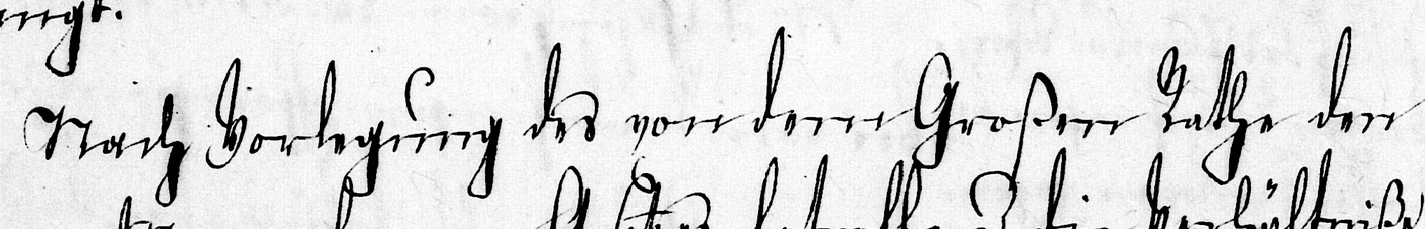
Nach Vorlegung des von dem Großen Rathe den
